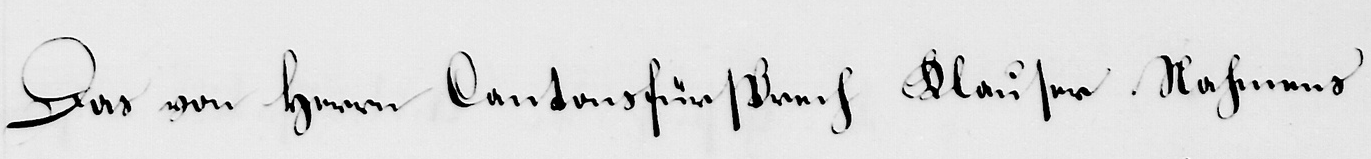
Das von Herrn Cantonsfürsprech Klauser Nahmens
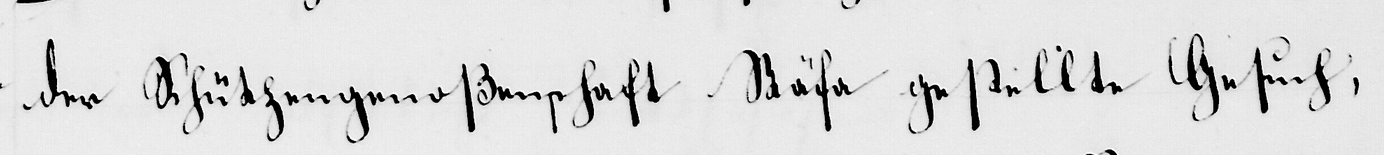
der Schützengenoßenschaft Stäfa gestellte Gesuch,
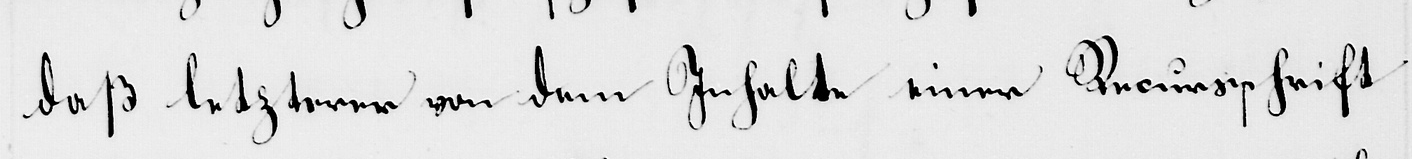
daß letzterer von dem Inhalte einer Recursschrift
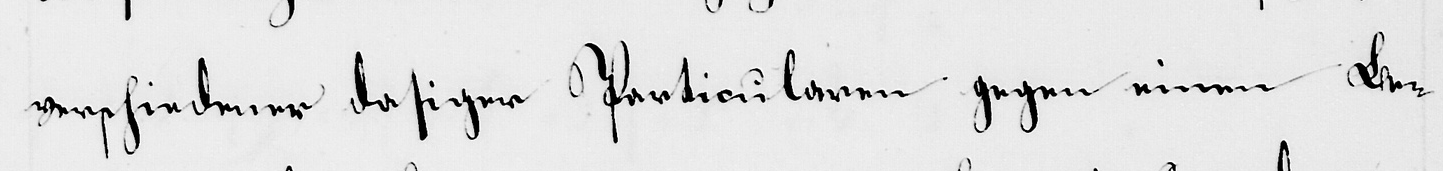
verschiedener dasiger Particularen gegen einen Be¬
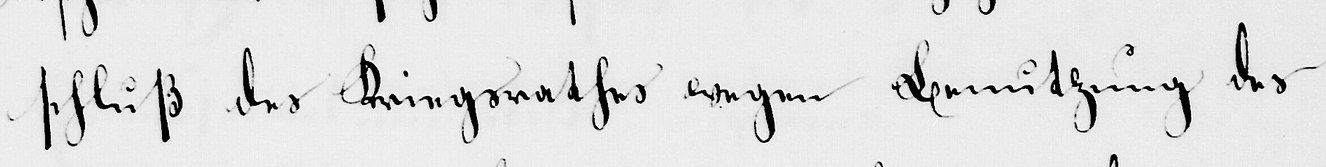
schluß des Kriegsrathes wegen Benutzung des
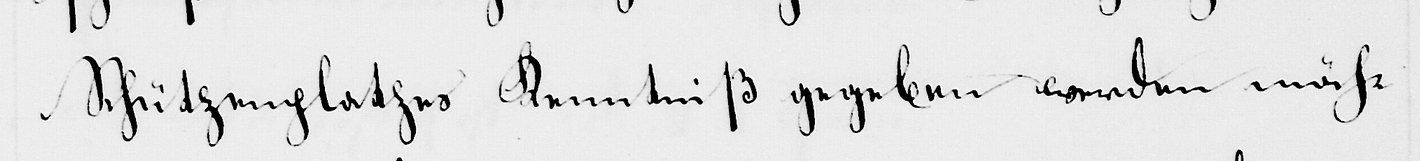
Schützenplatzes Kenntniß gegeben werden möch¬
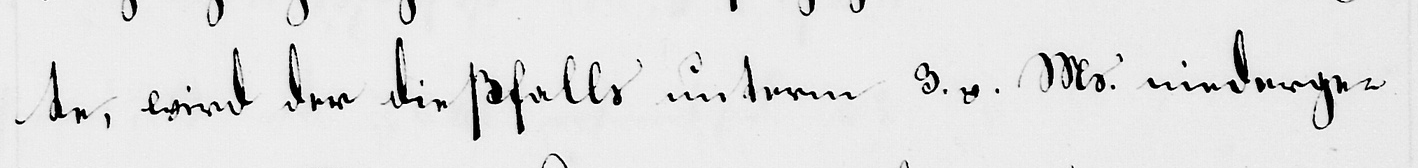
te, wird der dießfalls unterm 3. v. Ms. niederge¬
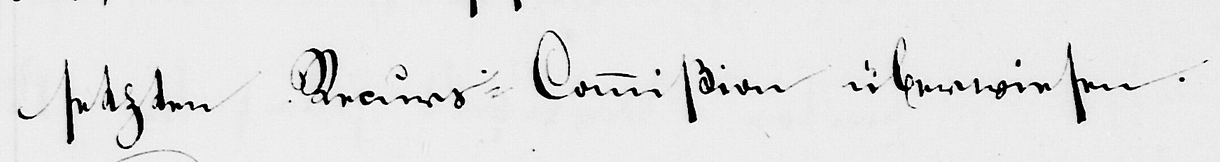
setzten Recurs-Commißion überwiesen.
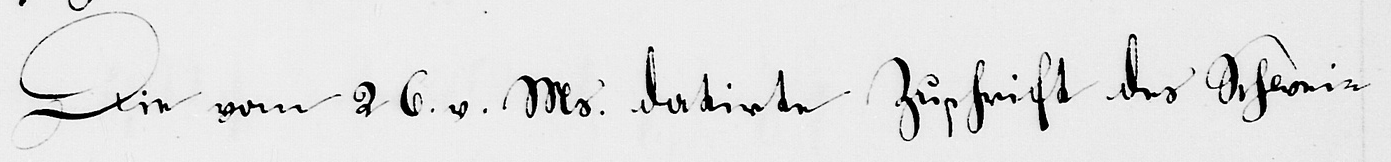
Die vom 26. v. Ms. datirte Zuschrift des Schwei¬
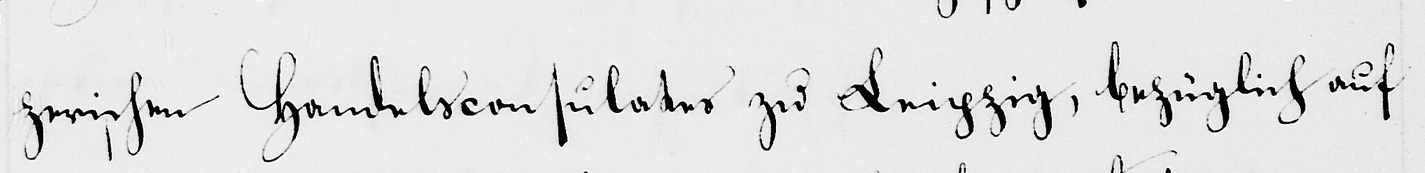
zerischen Handelsconsulates zu Leipzig, bezüglich auf
